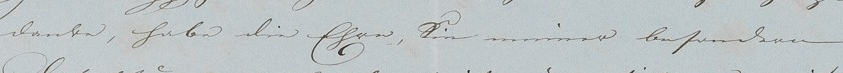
danke, habe die Ehre, Sie meiner besondern
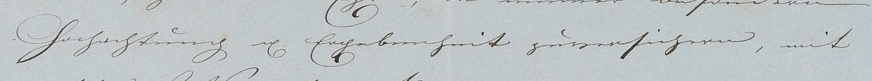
Hochachtung & Ergebenheit zuversichern, mit
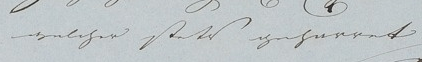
welcher stets geharret
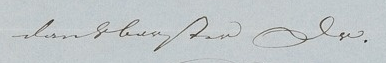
dankbarster Dr.
